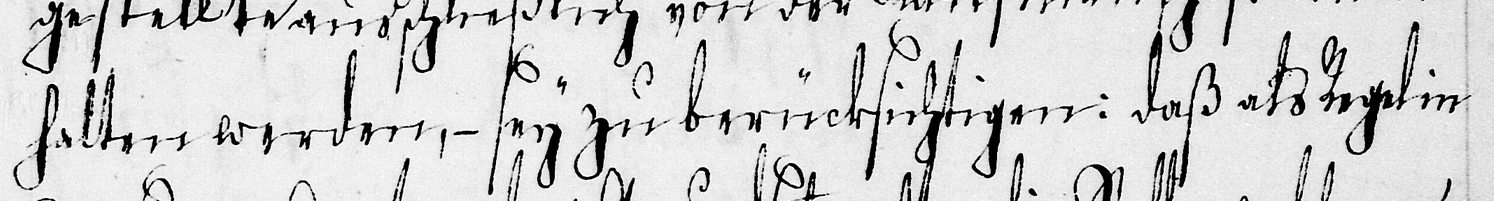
halten werden,– sey zu berücksichtigen: daß als Regel in
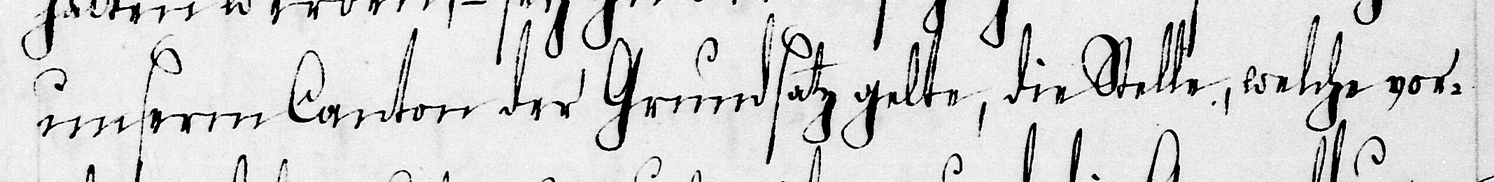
unserm Canton der Grundsatz gelte, die Stelle, welche vor¬
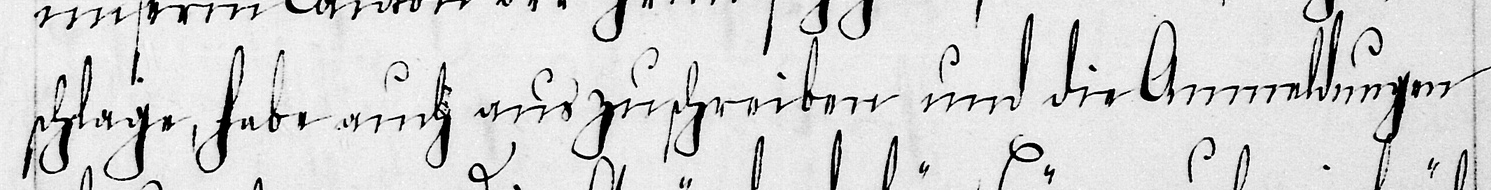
schlage, habe auch auszuschreiben und die Anmeldungen
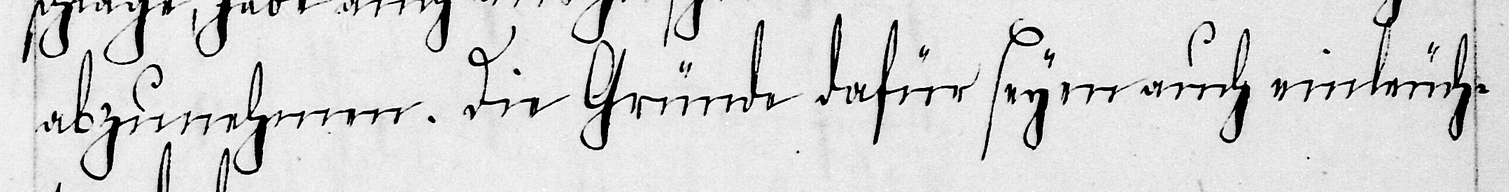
abzunehmen. Die Gründe dafür seyen auch einleuch¬
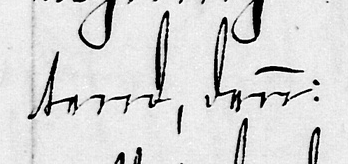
tend, denn:
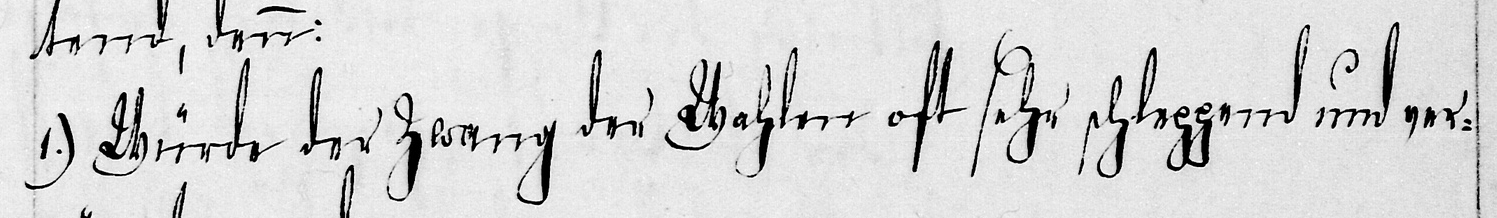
1.) Würde der Zwang der Wahlen oft sehr schleppend und ve¬
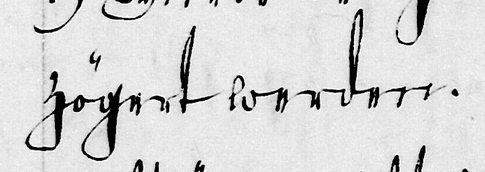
rzögert werden.
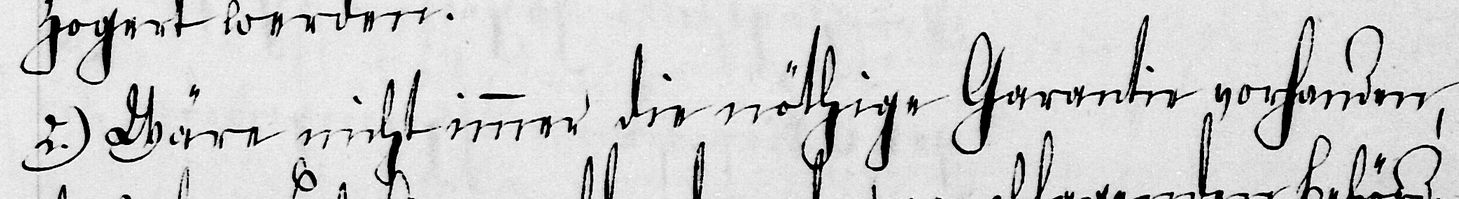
2.) Wäre nicht immer die nöthige Garantie vorhanden,
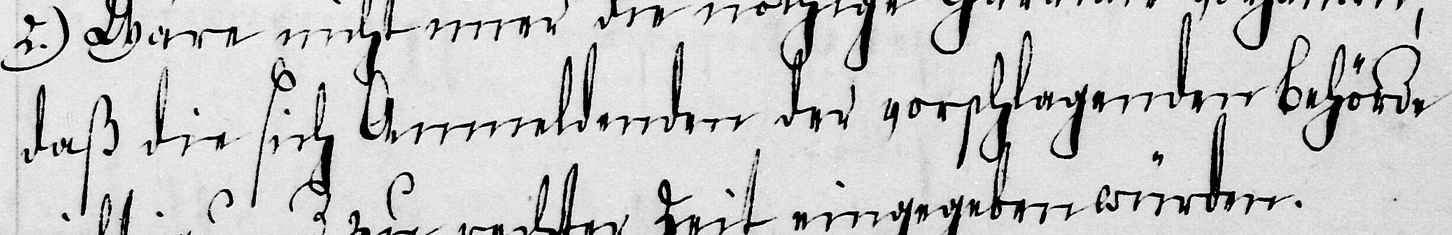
daß die sich Anmeldenden der vorschlagenden Behörde
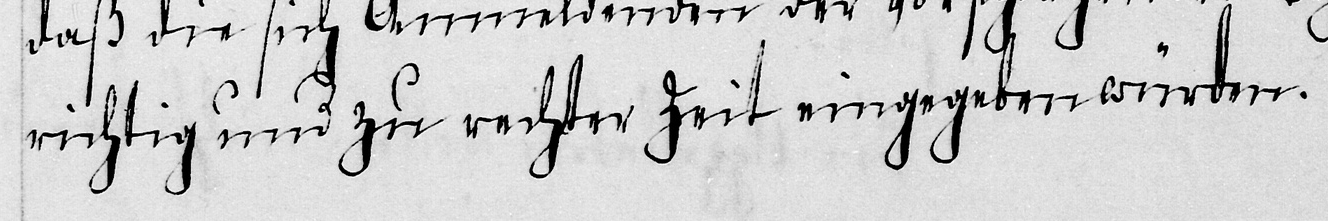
richtig und zu rechter Zeit eingegeben würden.
